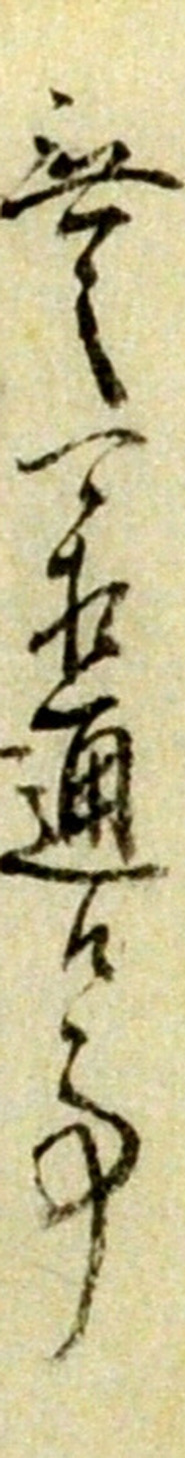無之可相通候事
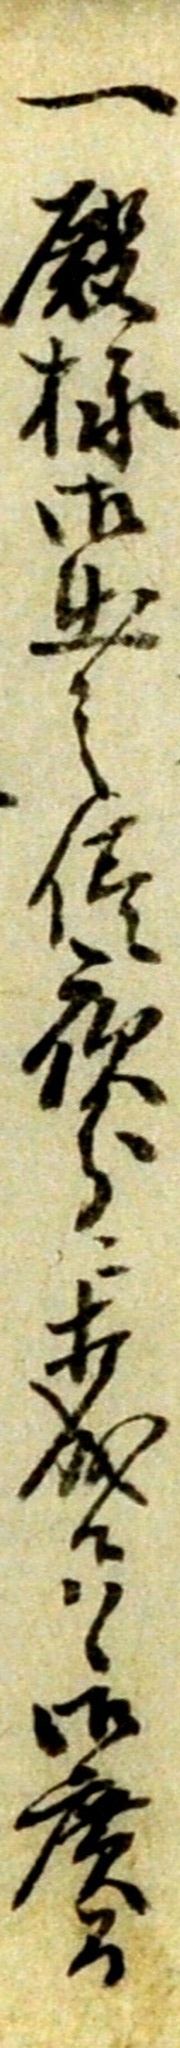一殿様御出之侭夜分ニ相成候ハヽ御広間
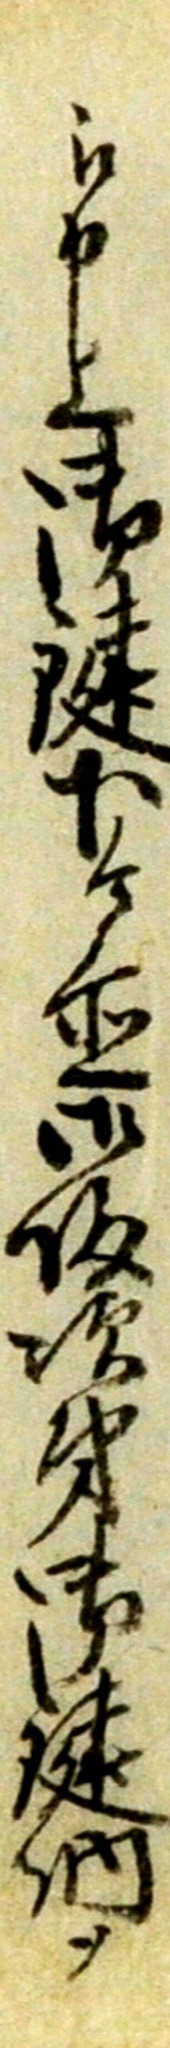江申上御鍵下ケ置御帰次第御鍵納メ
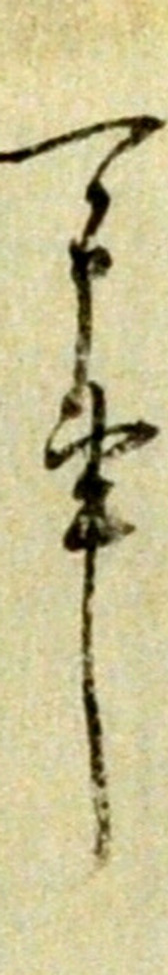可申事
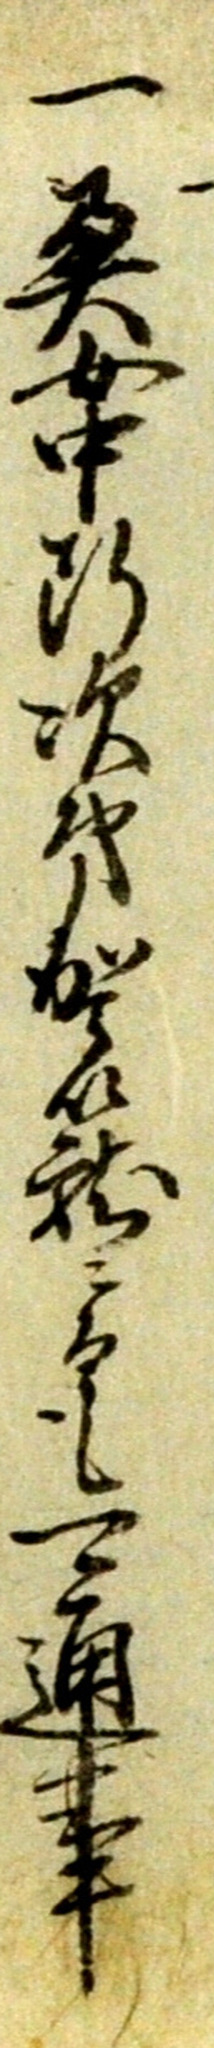一奥女中断次第駕籠ニ而も可通事
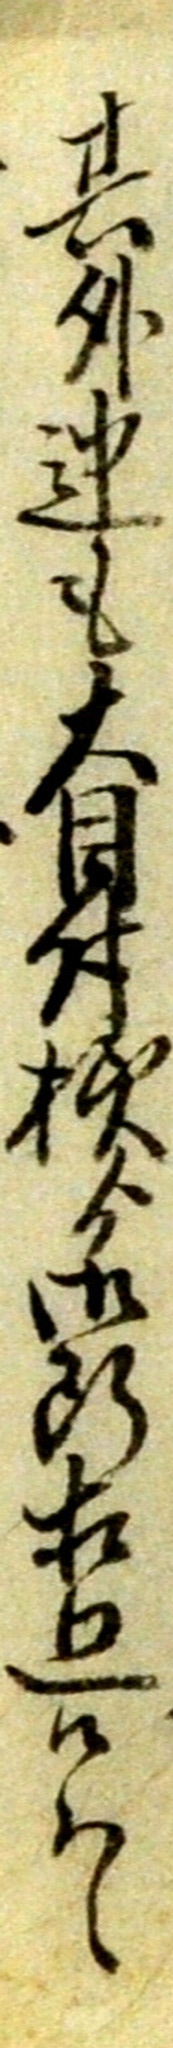其外迚も大目付様ゟ御断相廻候ハヽ
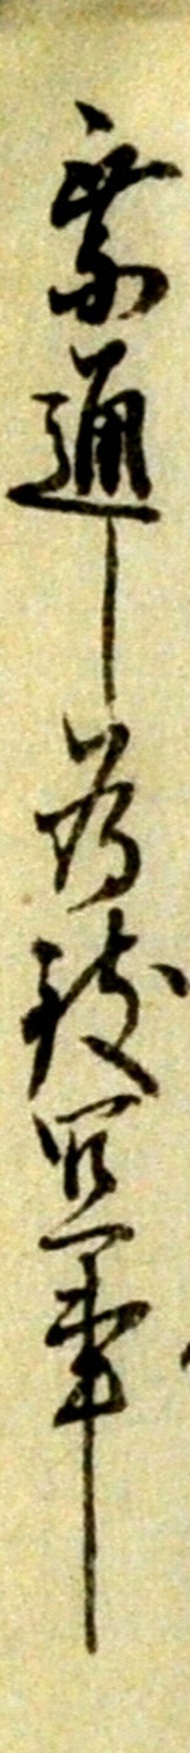乗通し為致宜事

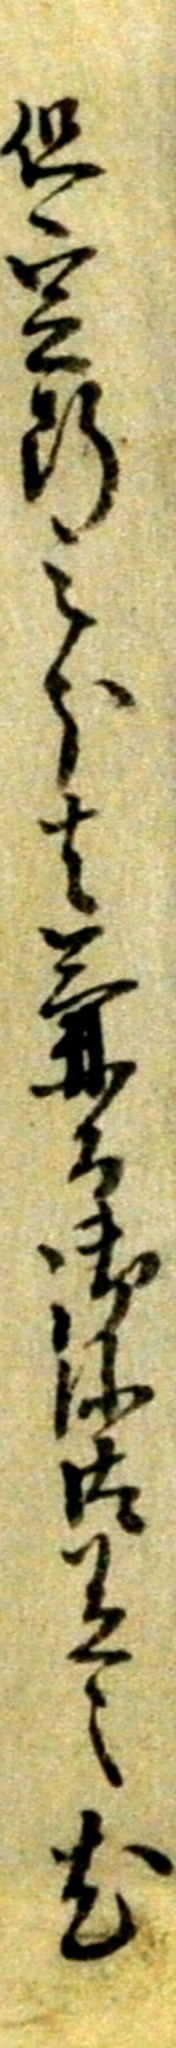但定断之分者兼而御沙汰有之尤
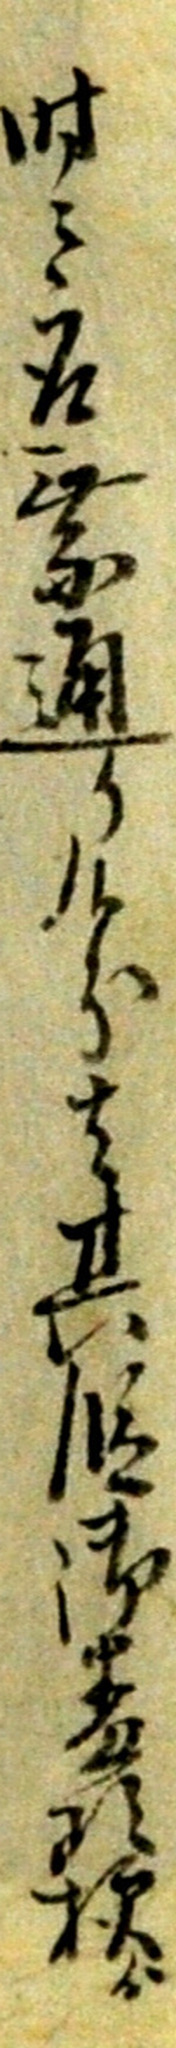時ニ取乗通り候分者其段御番頭様ゟ
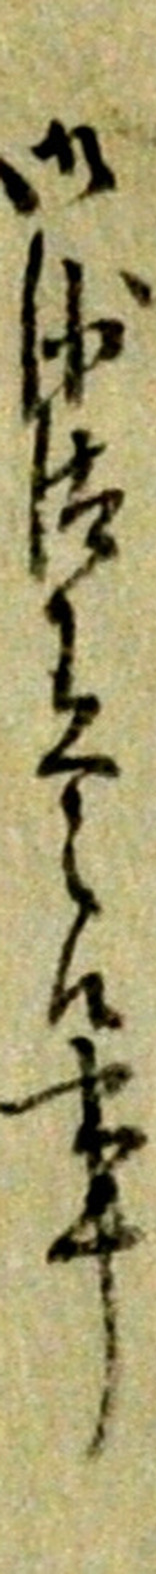御沙汰有之候事
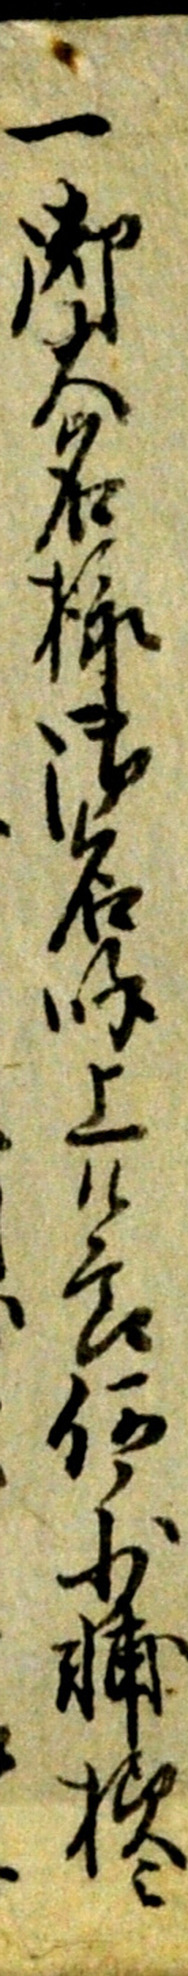一御大名様御名呼上候節何ノ少輔様と
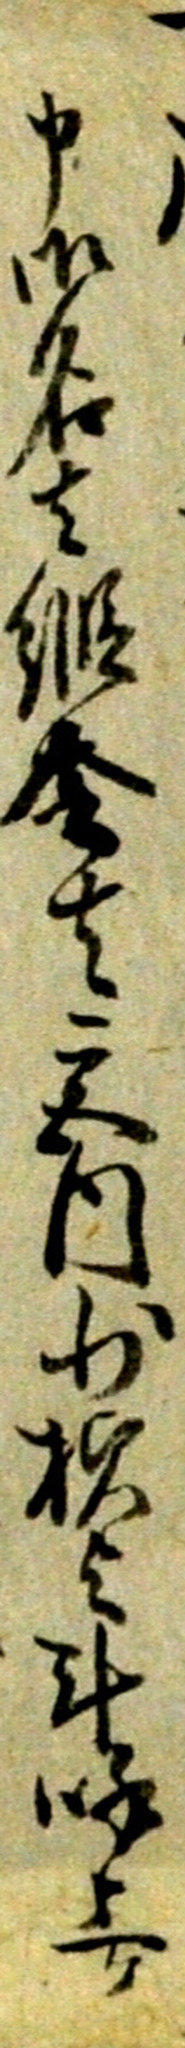申御名者縦令者宮内少様と斗呼上ケ
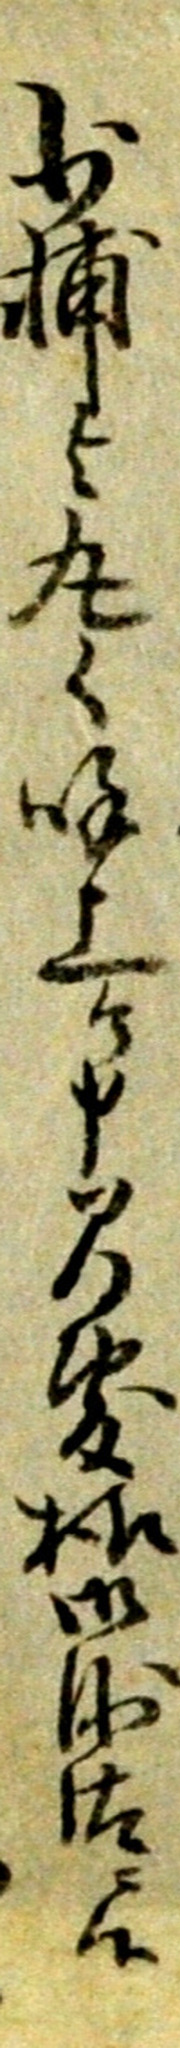少輔と丸く呼上ケ申間敷様御沙汰ニ候
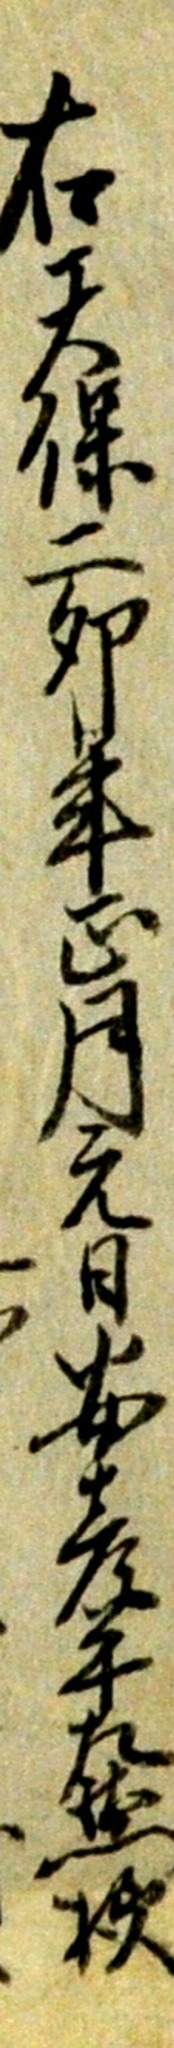右天保二卯年正月元日安彦平左衛門様
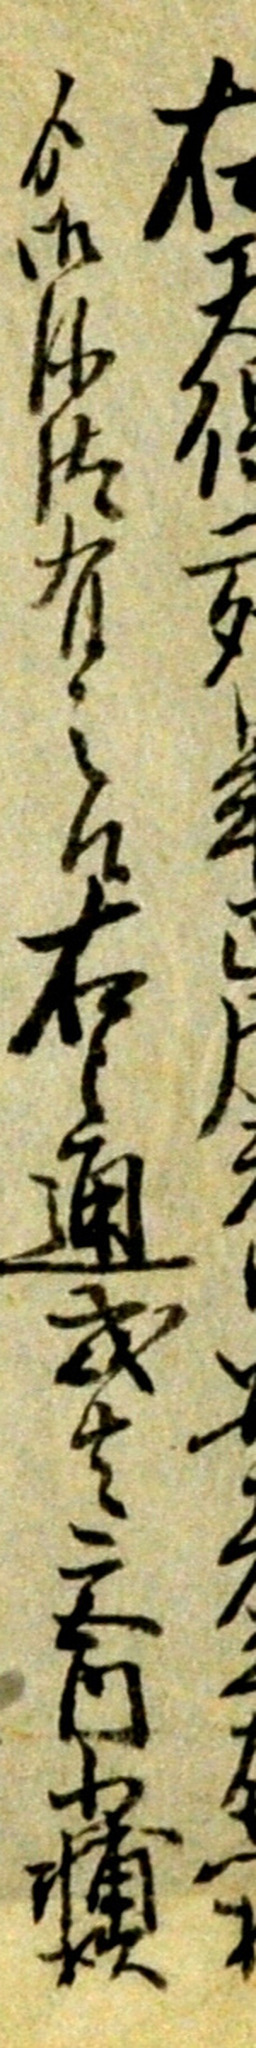ゟ御沙汰有之候右之通或物宮内少輔様
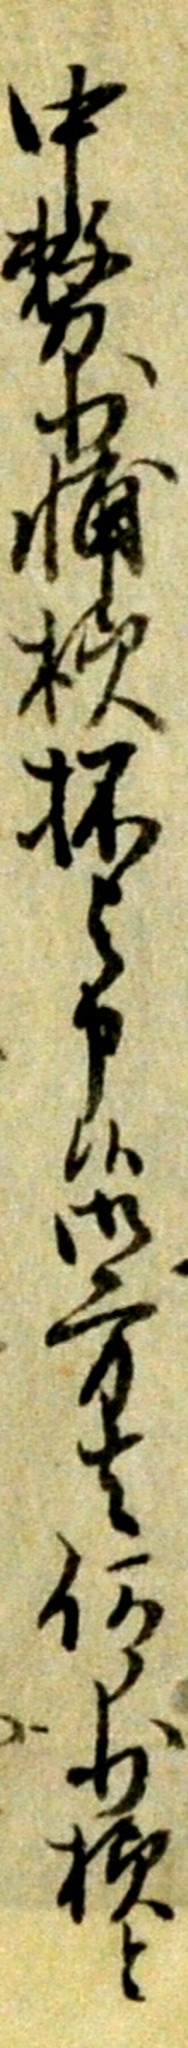中務少輔様抔と申候御方者何ノ少様と
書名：御先手組江戸御屋敷御門番勤方
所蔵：伊那市立高遠町図書館・合同会社AMANE
